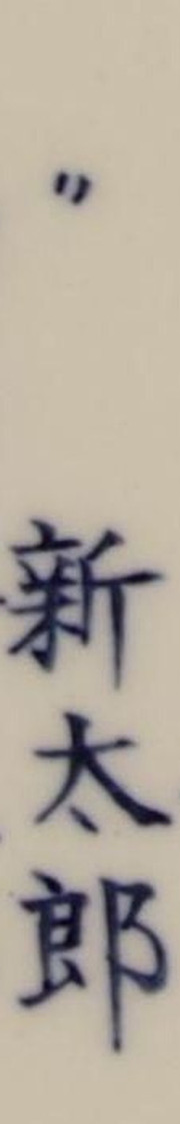新太郎
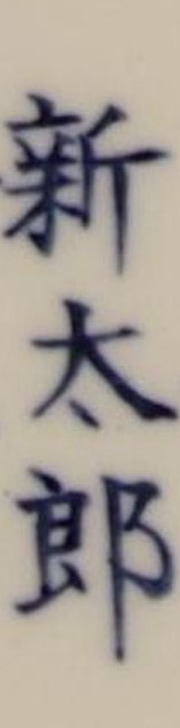新太郎
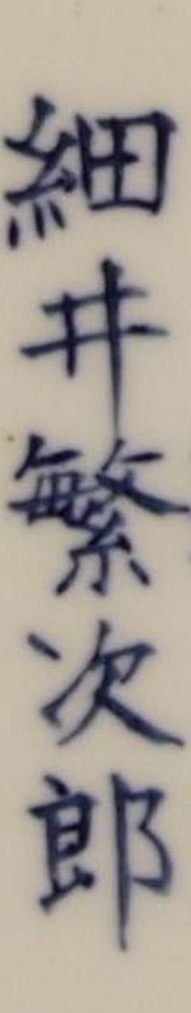細井繁次郎
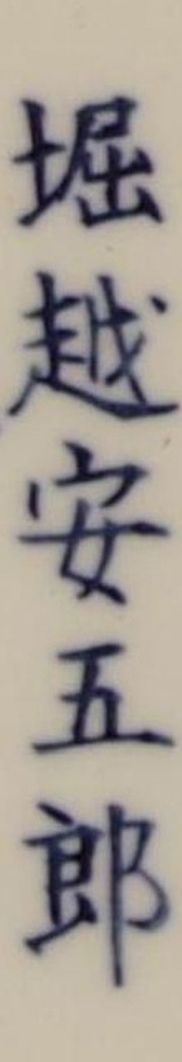堀越安五郎
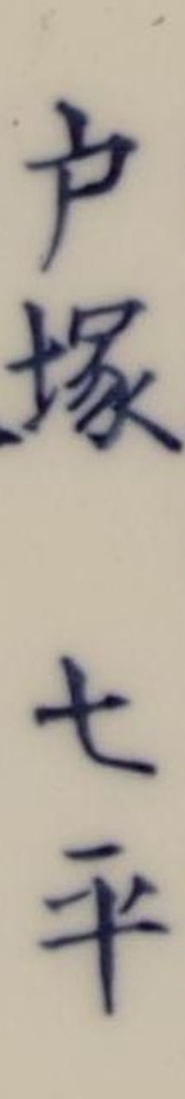戸塚七平
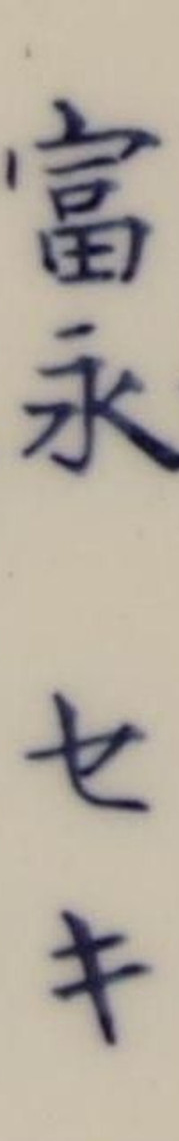富永セキ
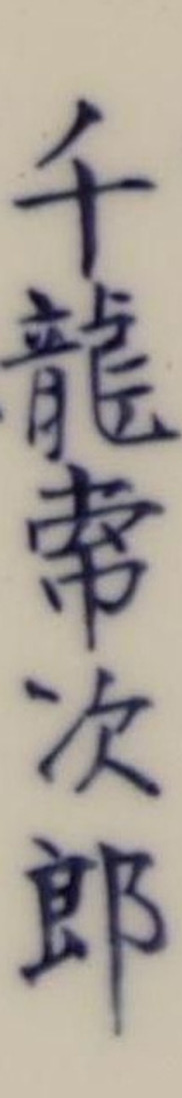千龍常次郎
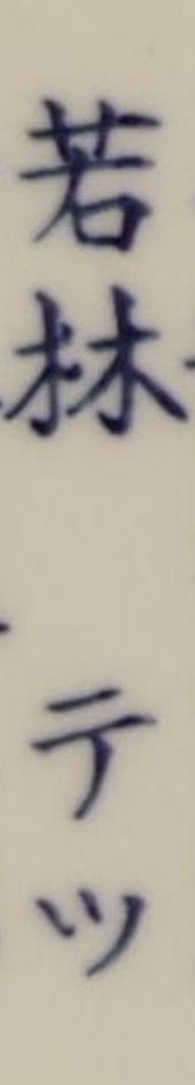若林テツ
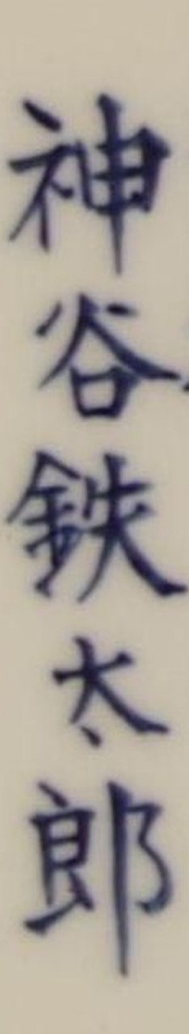神谷鉄太郎

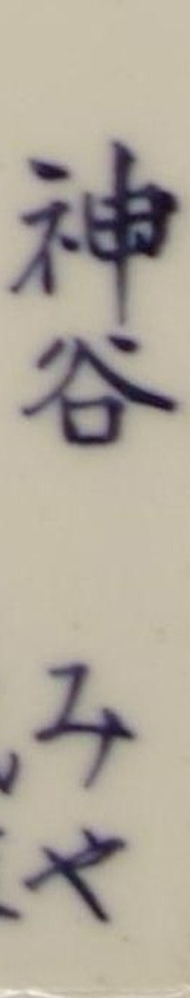神谷みや
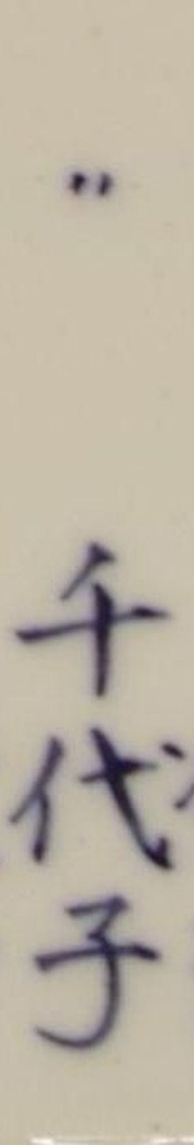千代子
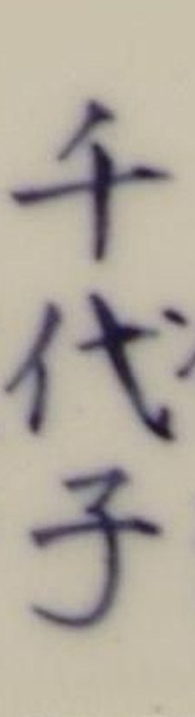千代子
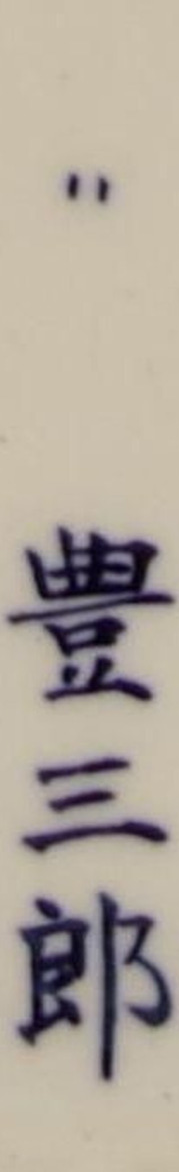豊三郎
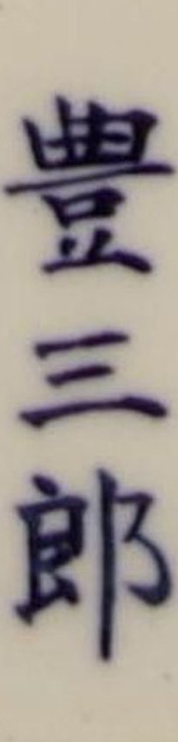豊三郎
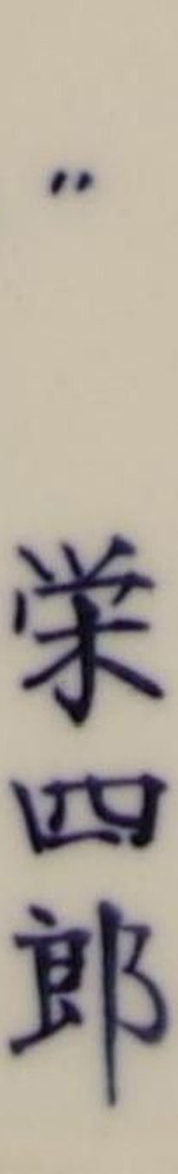栄四郎
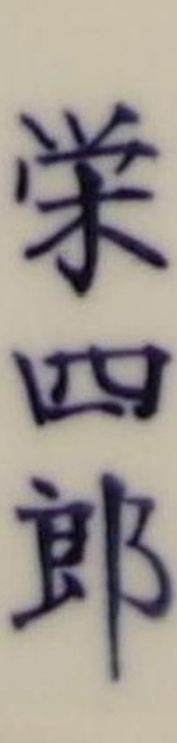栄四郎
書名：E~L
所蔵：高野山金剛峯寺
